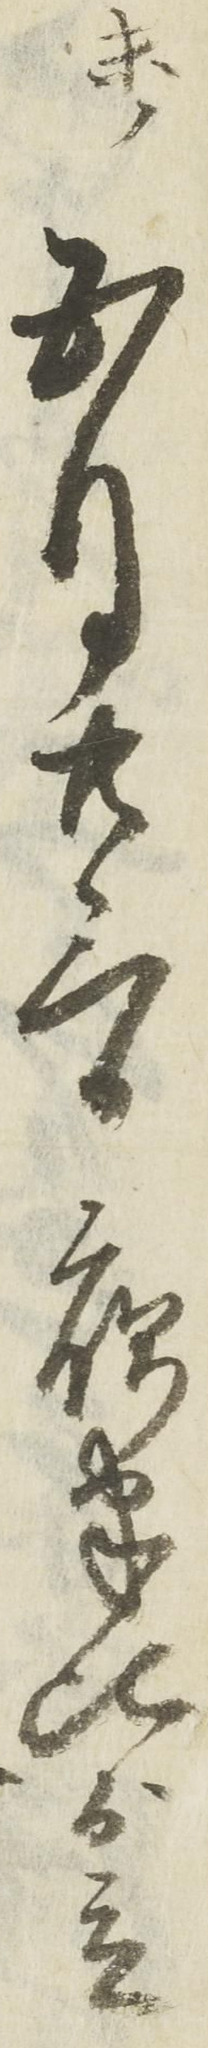未ノ五月廿三日夜半比ゟ立
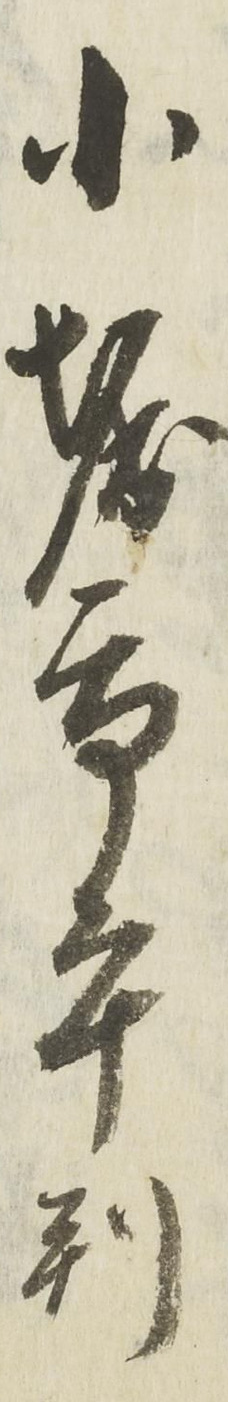小堀市平判
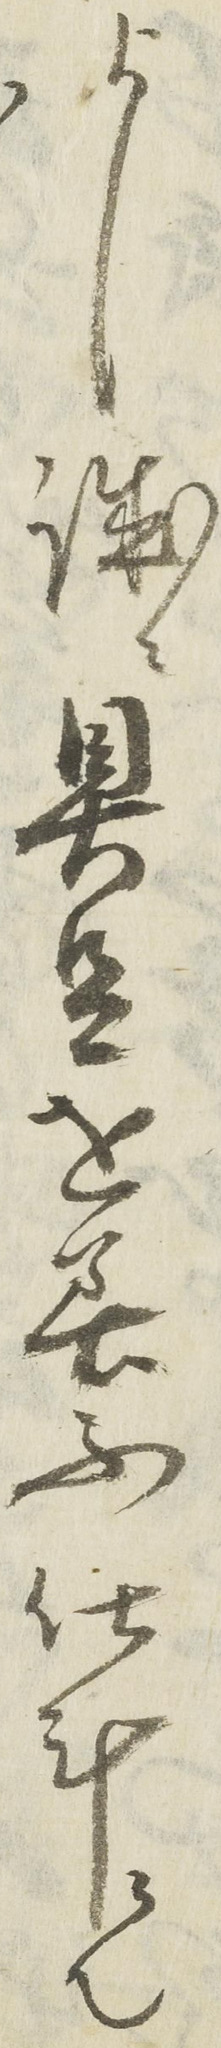已上誠ニ具足を着不仕計ニて
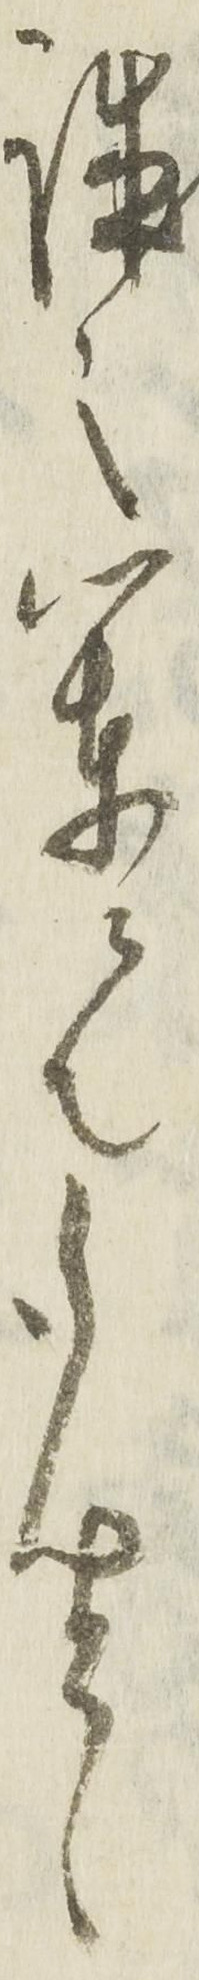誠之軍ニて御坐候
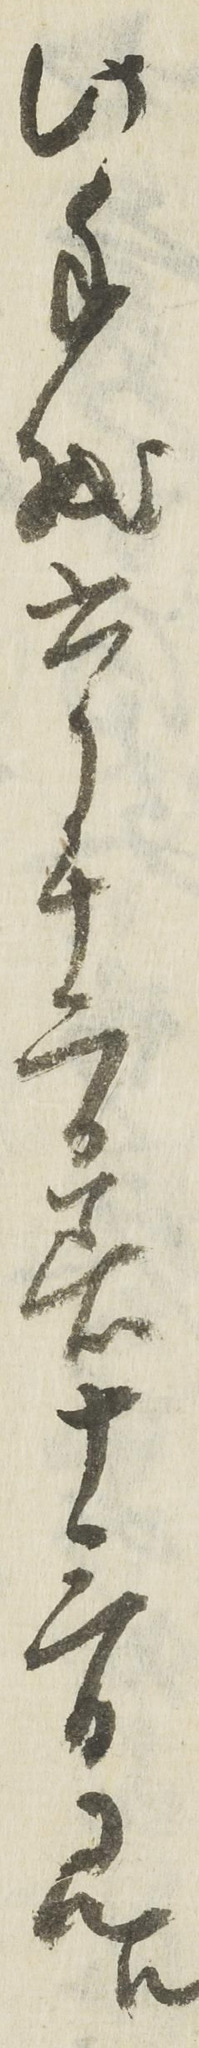此手紙六月十二日着十三日見ル
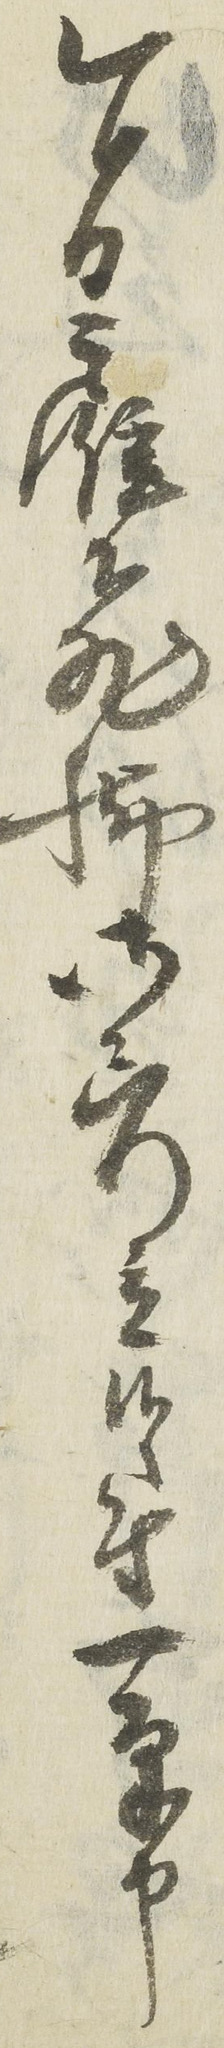今日雇飛脚御差立候付一筆申
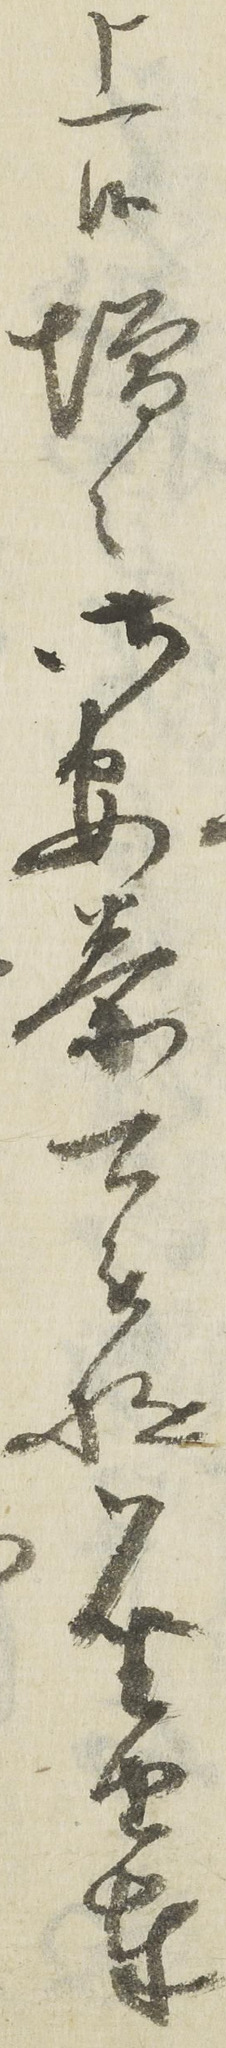上候増々御安泰可被遊御坐由奉
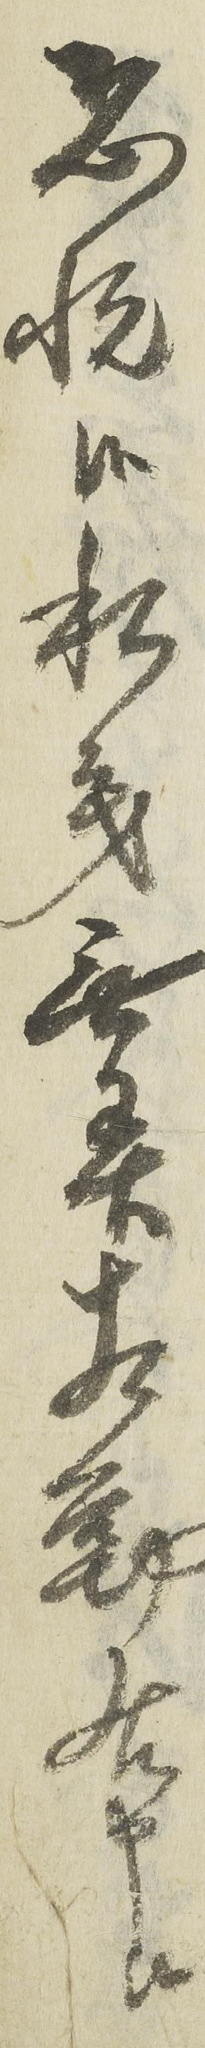恐悦候私義無異相勤居申候

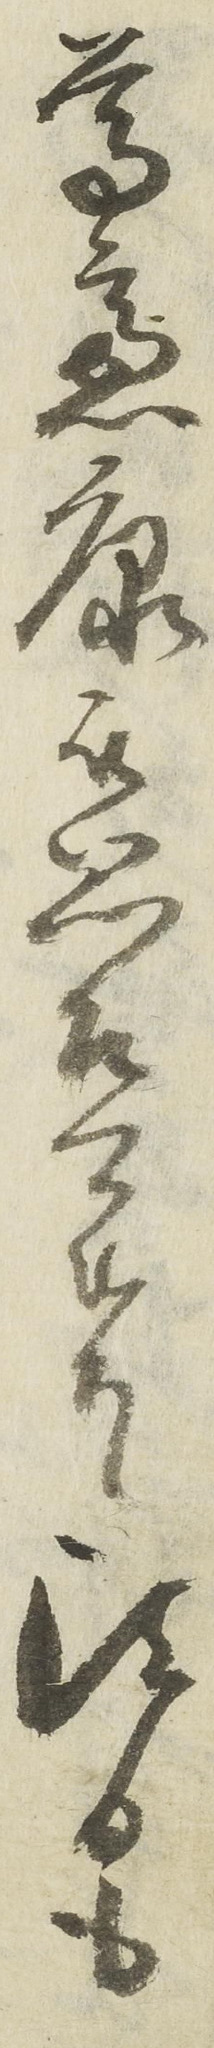尊慮康被思召可被下候頃日も
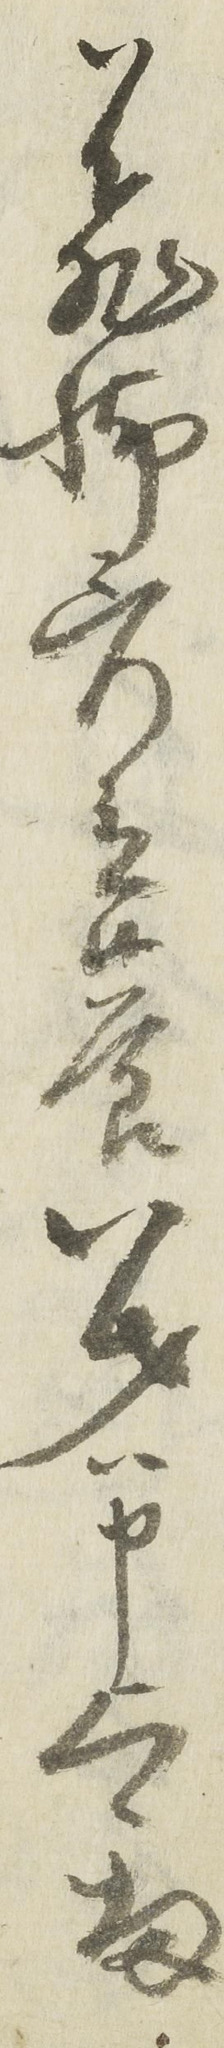御飛脚差立候節義は申上候扨
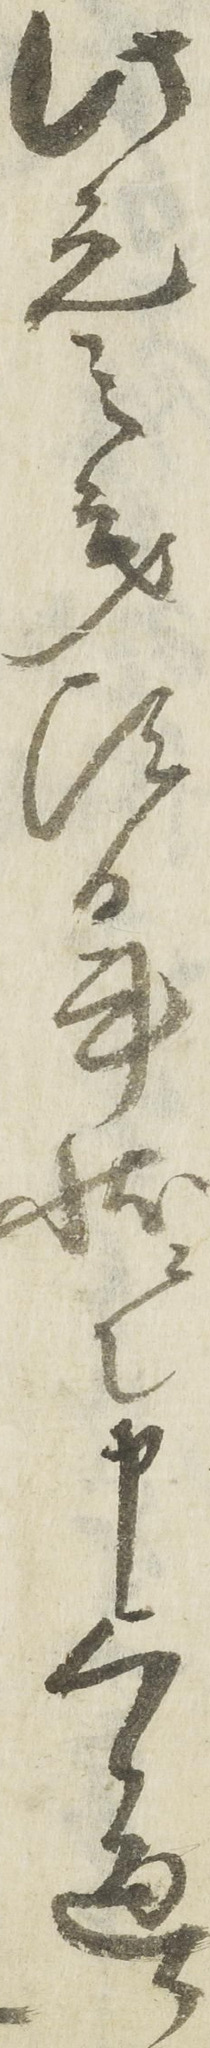此元之義頃日書状ニて申上候通り
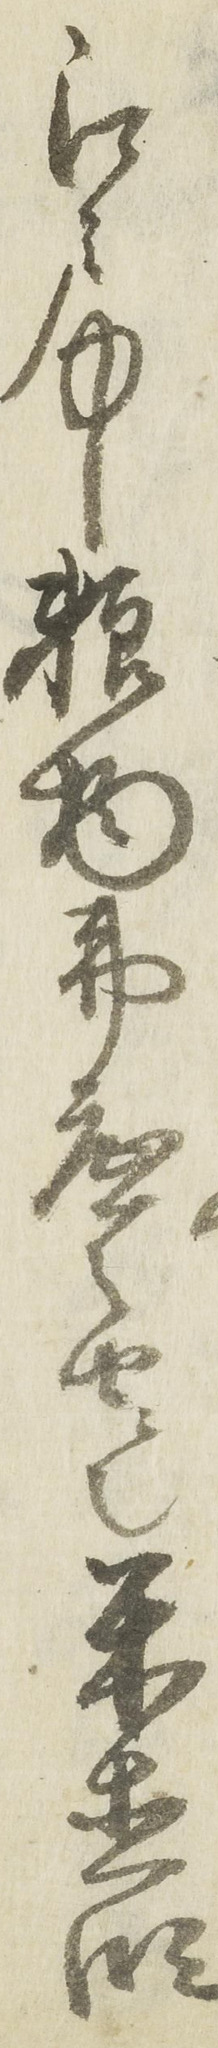江戸中粮物払底之由ニて米直段
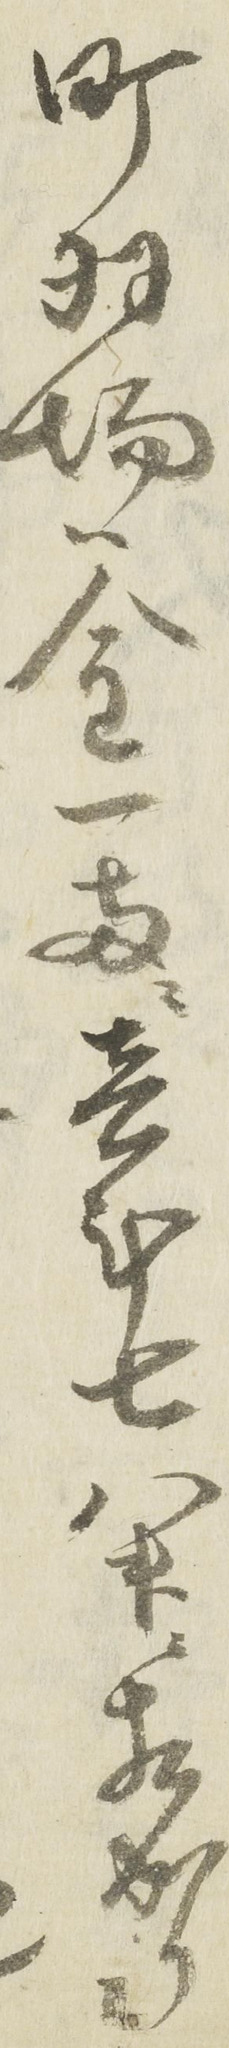町相場は金一両ニ壱斗七八升ニ相成候
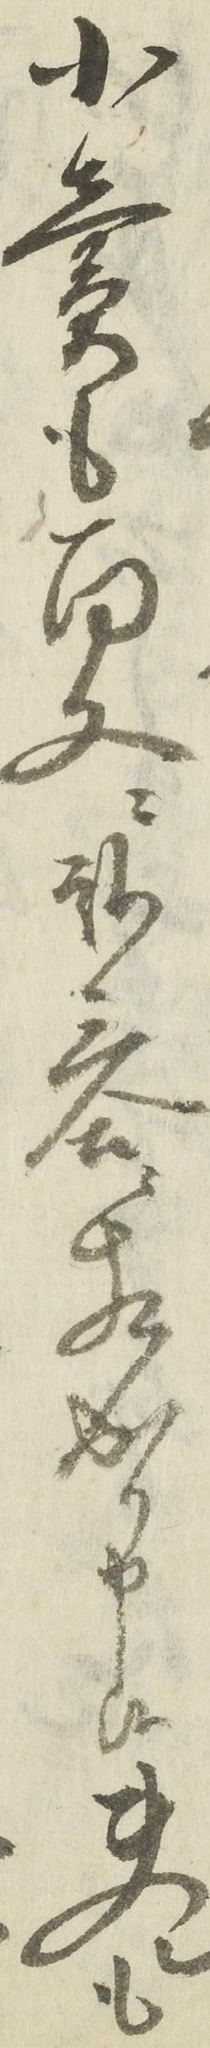小売も百文ニ弐三合ニ相成り申候夫レも
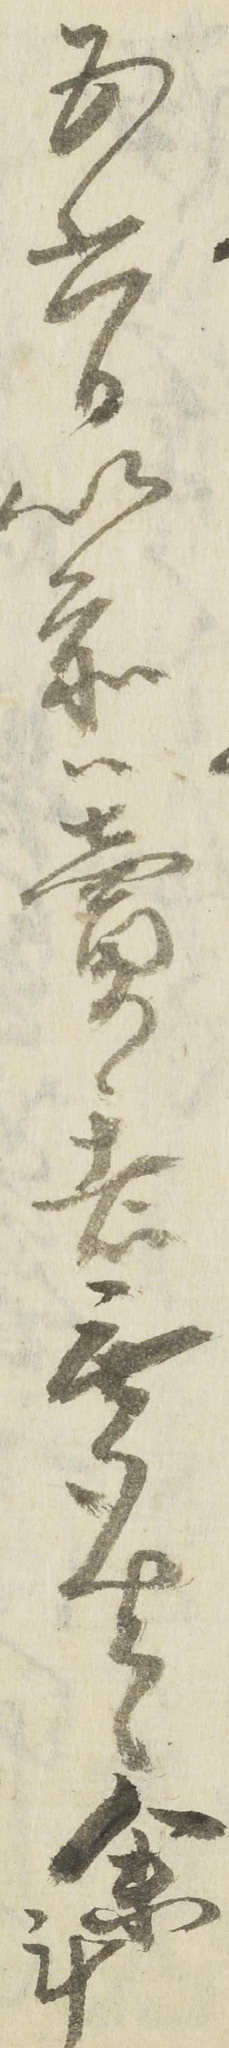五六日以前は売候者無御坐候余計
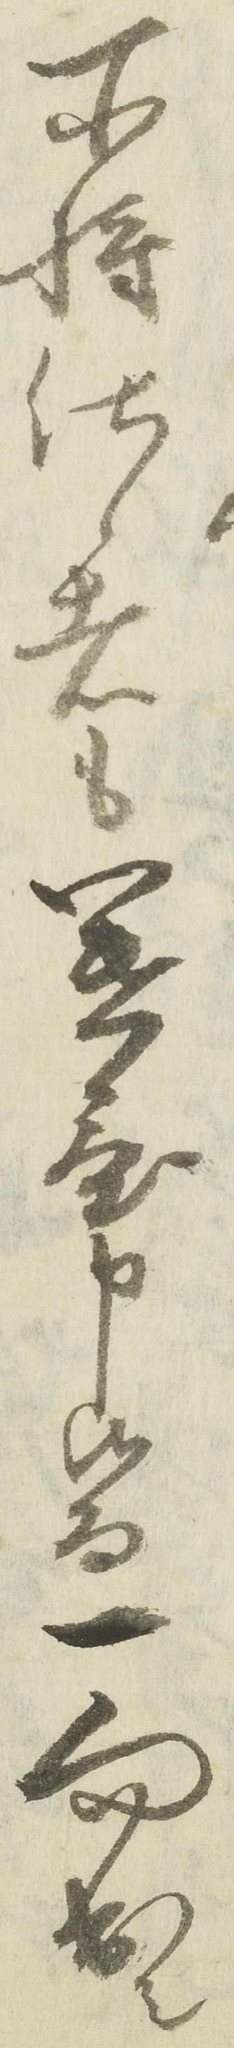所持仕候者も運置申候而一向出シ
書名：後見笑
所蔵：東京大学地震研究所図書室 Earthquake Research Institute Library, The University of Tokyo, JAPAN
